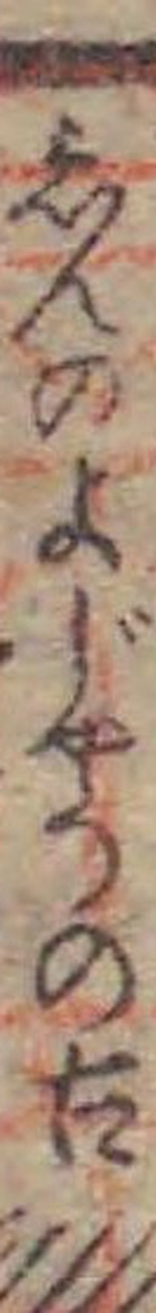しんのよじやうの古
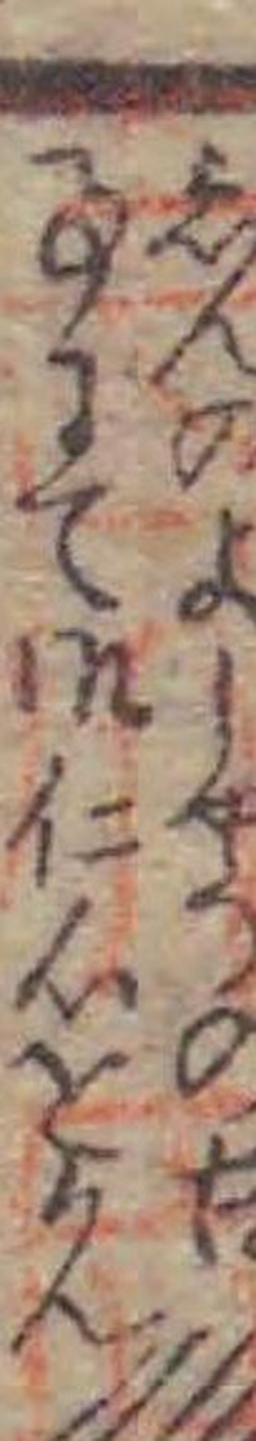事にて御仁心をかん
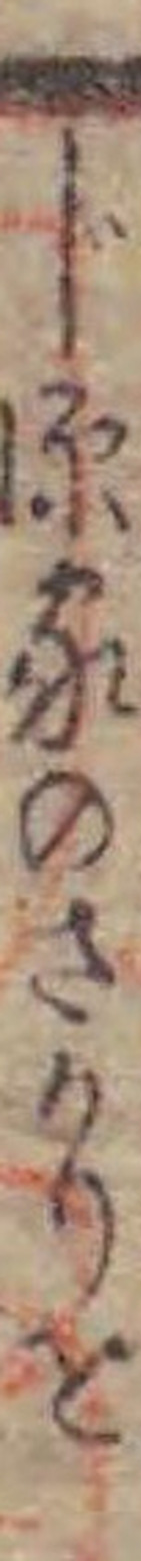じ源家のさかりを
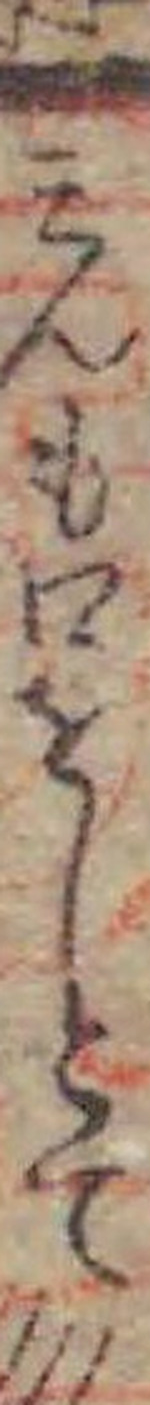みんも口をしとて
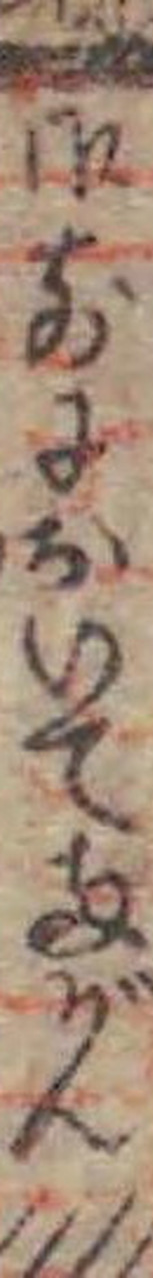御前において両がん
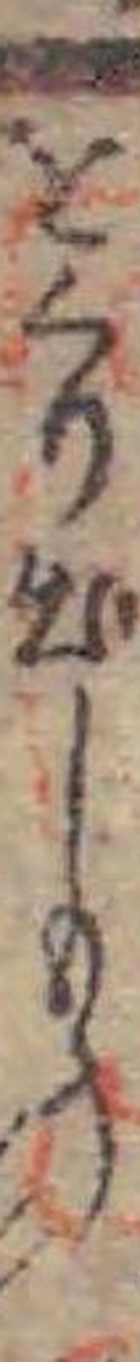をくり出しもう
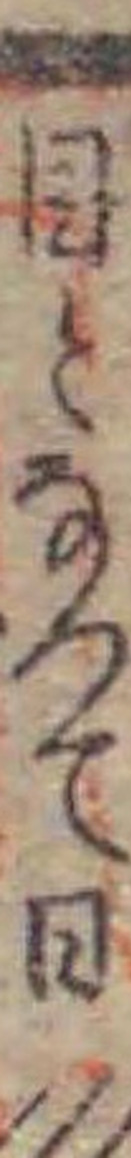目となつて日
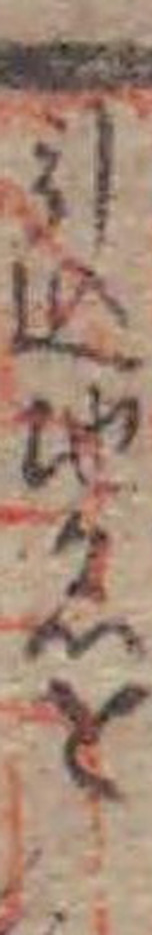引込地名を
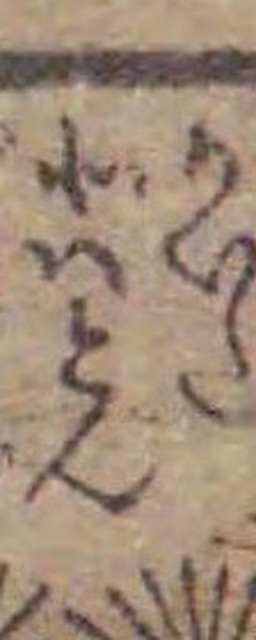所はとん

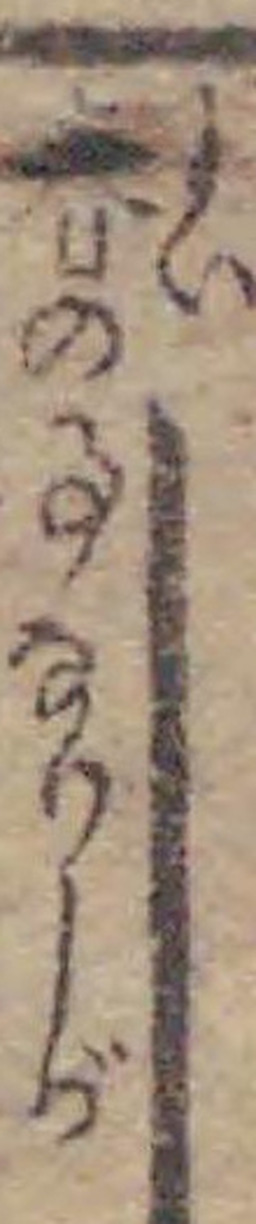春の事なりしが
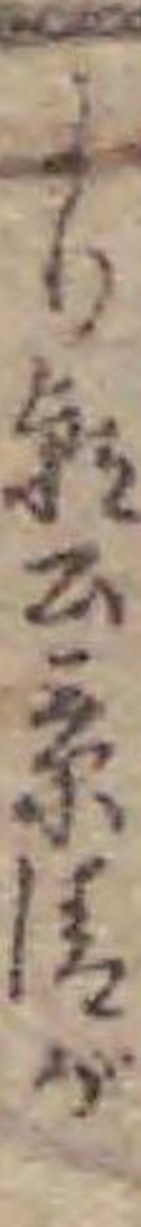より朝公景清が
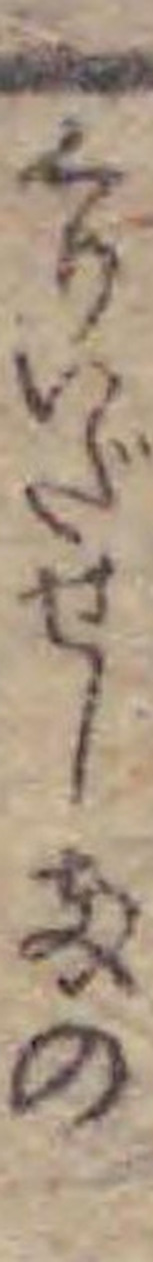くりいだせし両の
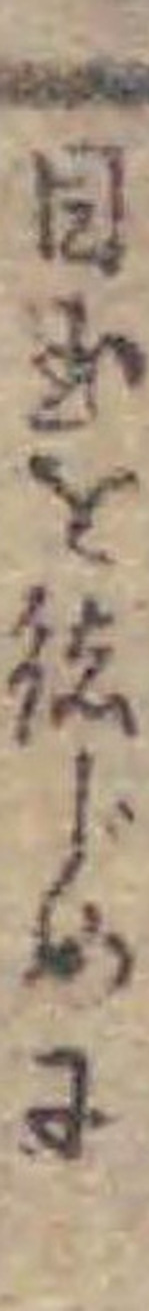目玉を緒じめに
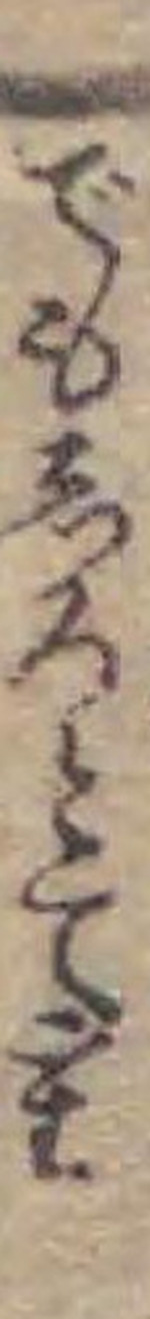でもしろとて重
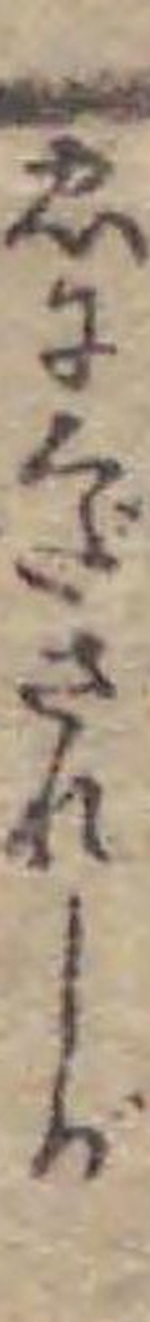忠にくだされしが
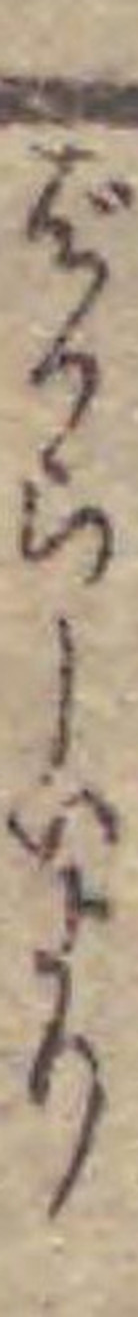ばからしいより
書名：悪七変目景清 : 2巻
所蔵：国立国会図書館 National Diet Library, JAPAN
